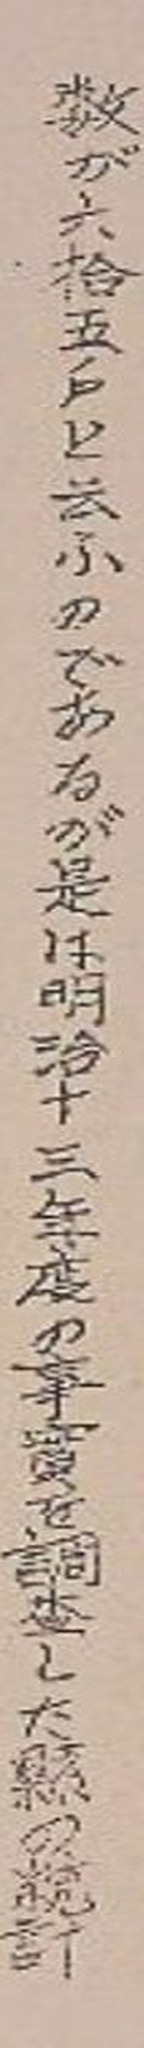数が六拾五戸と云ふのであるが是は明治十三年度の事実を調査した県の統計
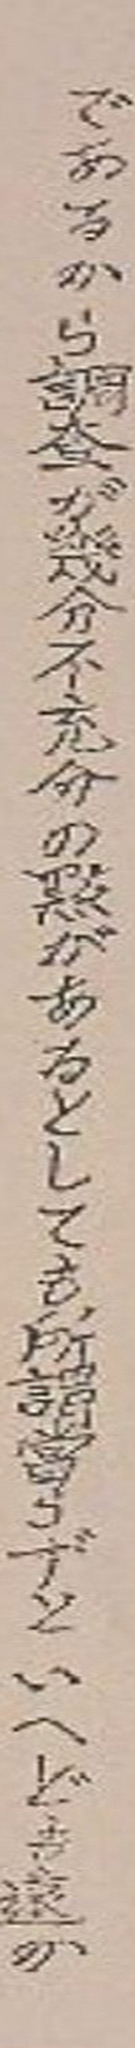であるから調査が幾分不充分の点があるとしても所謂当らずといへども遠か
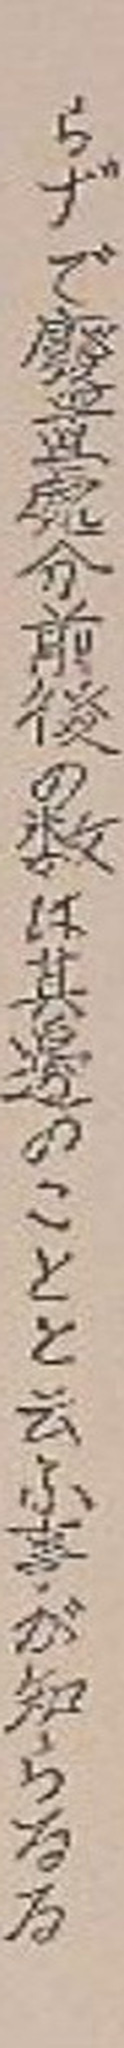らずで廃置処分前後の数は其辺のことと云ふ事が知らるる
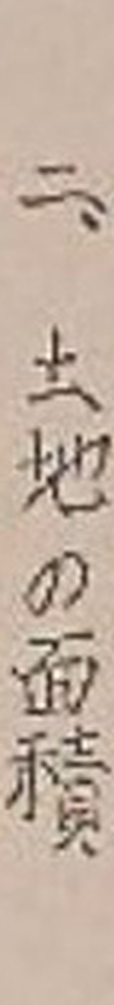ニ．土地の面積
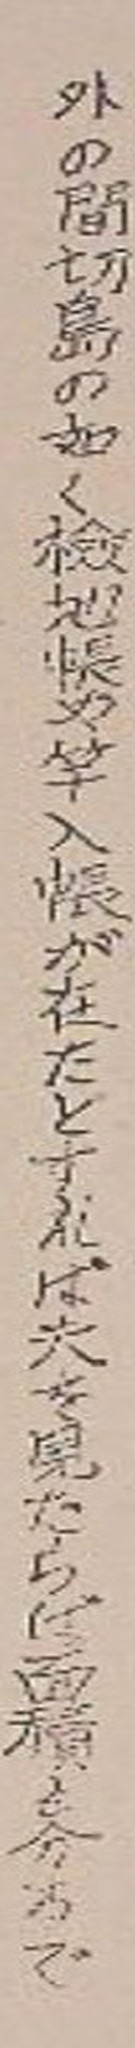外の間切島の如く検地帳や竿入帳が在たとすれば夫を見たらば面積も分るで
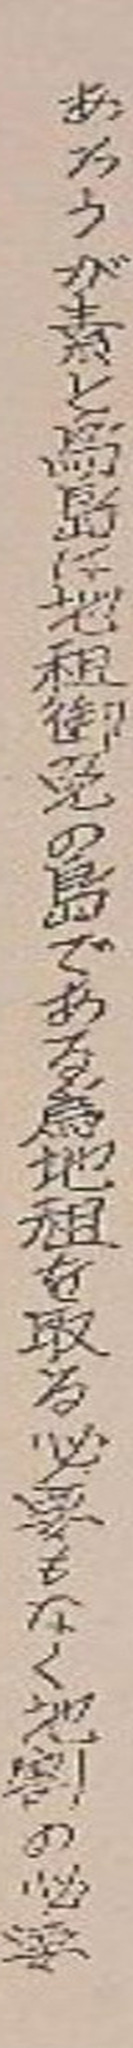あろうが素と鳥島は地租御免の島である為地租を取る必要もなく地割の必要
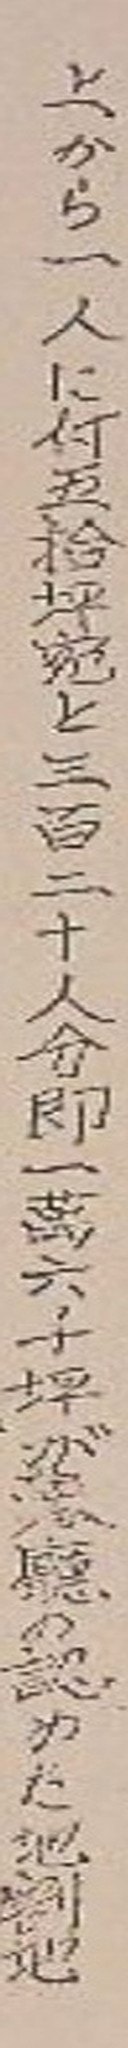上から一人に付五拾坪宛と三百二十人分即一萬六千坪が藩庁の認めた地割地
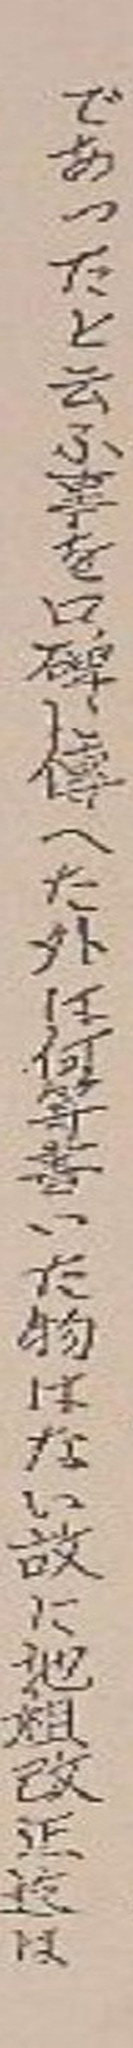であつたと云ふ事を口碑に伝へた外は何等書いた物はない故に地租改正迄は
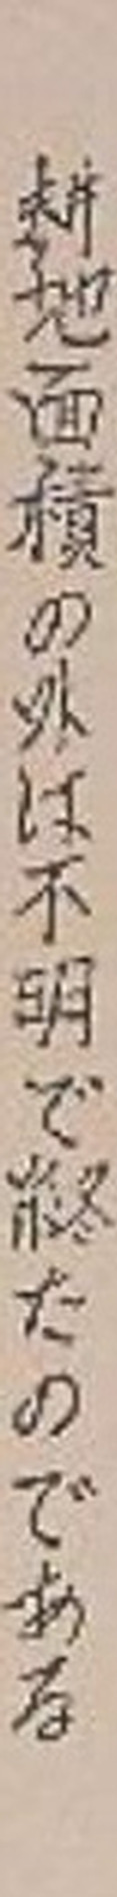耕地面積の外は不明で終たのである
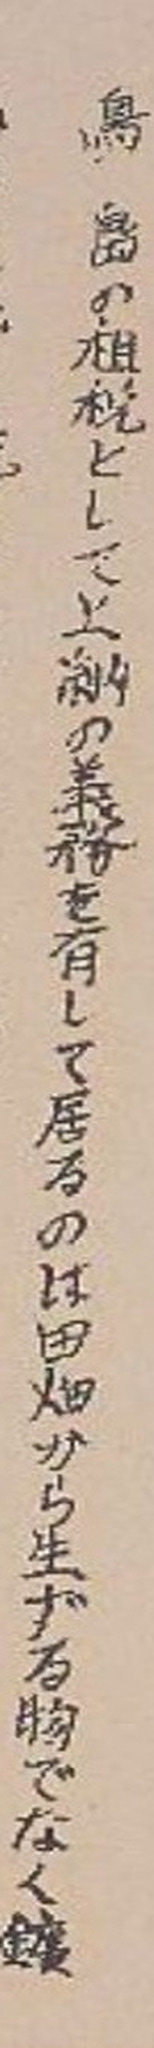鳥島の租税として上納の義務を有して居るのは田畑から生ずる物でなく鉱
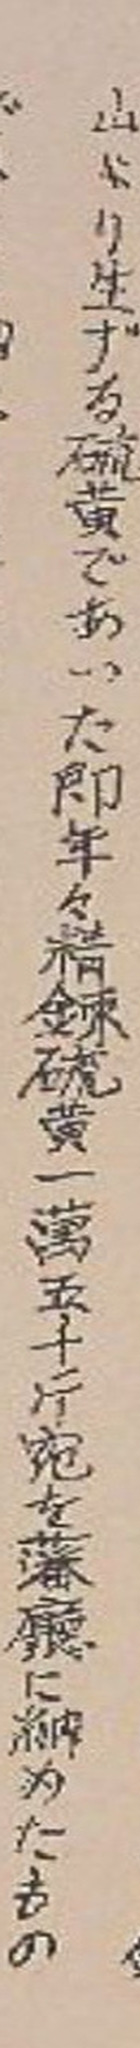山より生ずる硫黄であつた即年々精錬硫黄一萬五千斤宛を藩庁に納めたもの
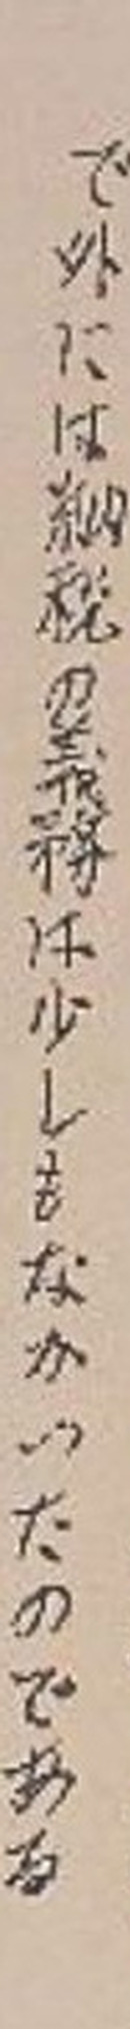で外には納税の義務は少しもなかつたのである
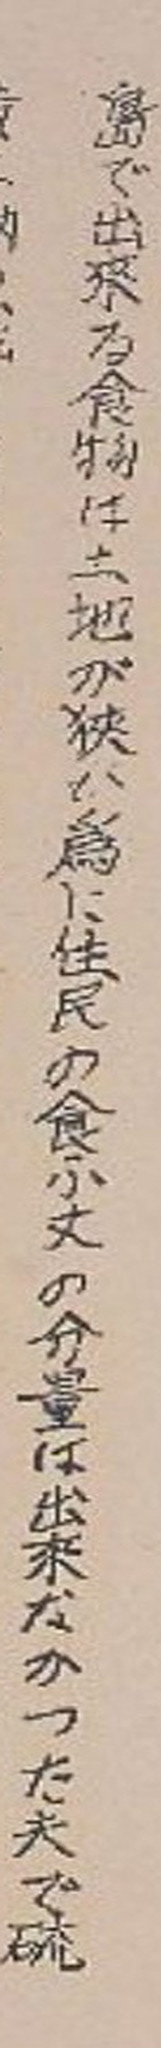島で出来る食物は土地が狭い為に住民の食ふ丈の分量は出来なかつた夫で硫
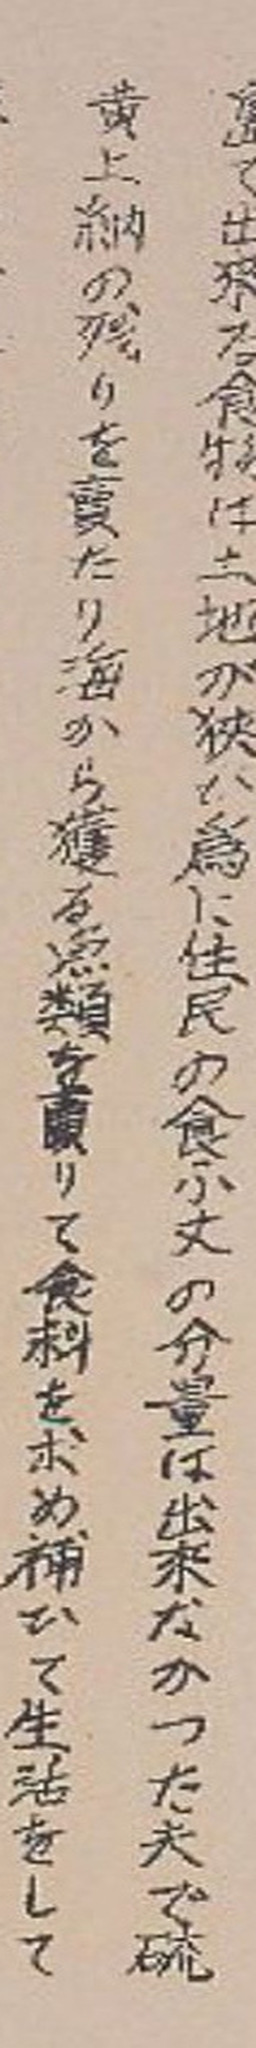黄上納の残りを売たり海から獲る魚類を売りて食料を求め補ひて生活をして
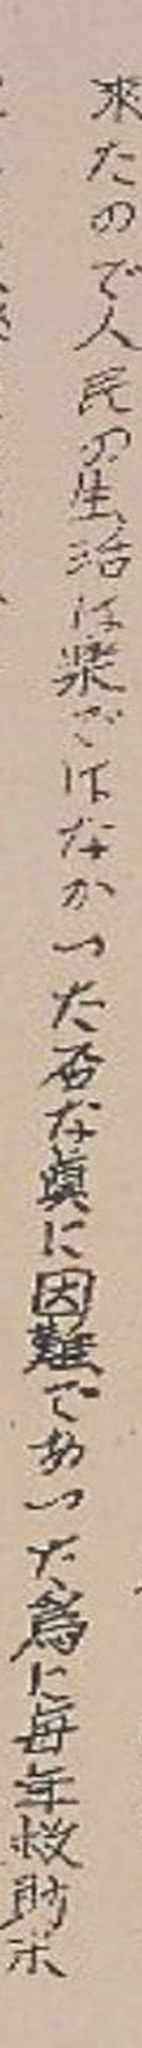来たので人民の生活は楽ではなかつた否な真に困難であつた為に毎年救助米
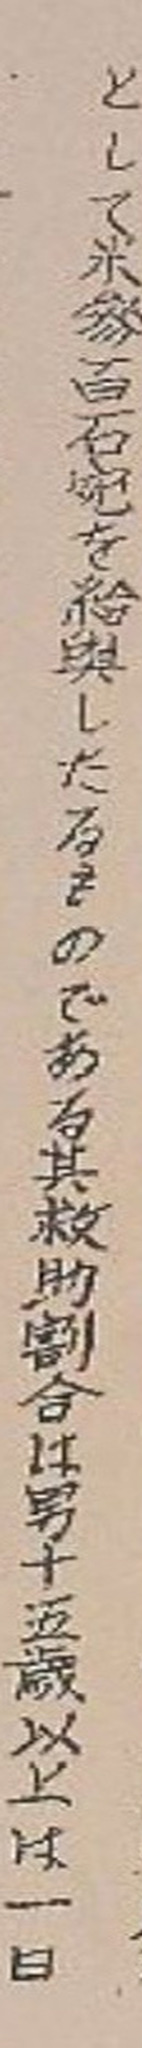として米参百石宛を給与したるものである其救助割合は男十五歳以上は一日
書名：鳥島移住始末
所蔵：University of the Ryukyus Library
